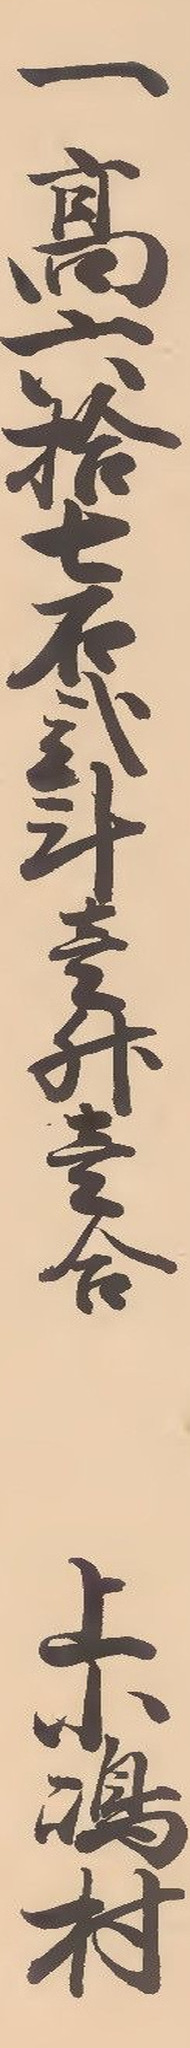一高六拾七石弐斗壱升壱合上小島村
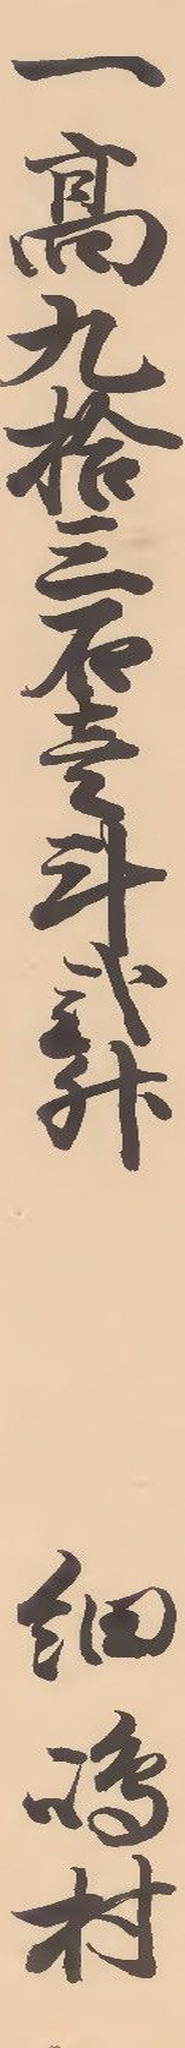一高九拾三石壱斗弐升細島村
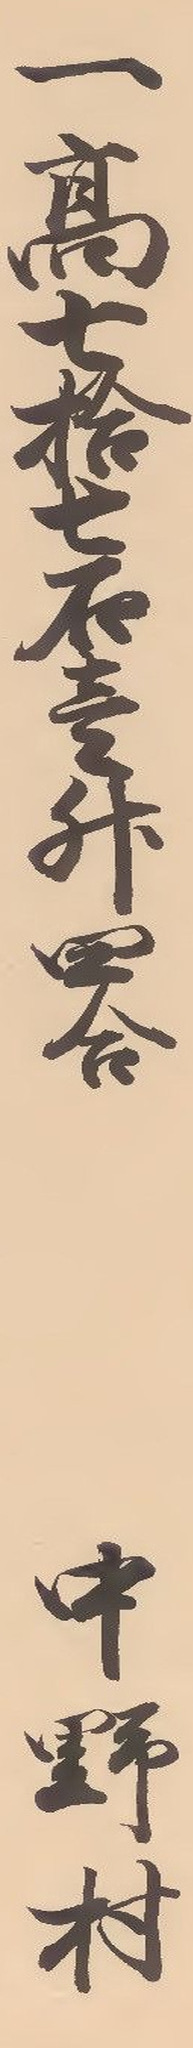一高七拾七石壱升四合中野村
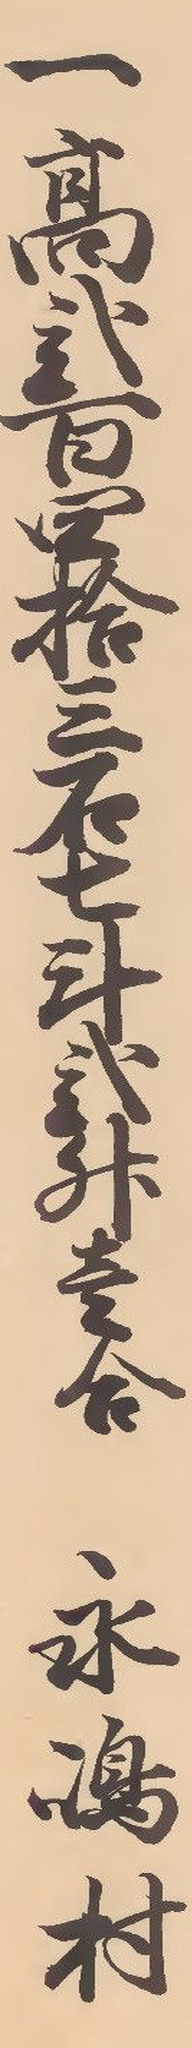一高弐百四拾三石七斗弐升壱合永島村

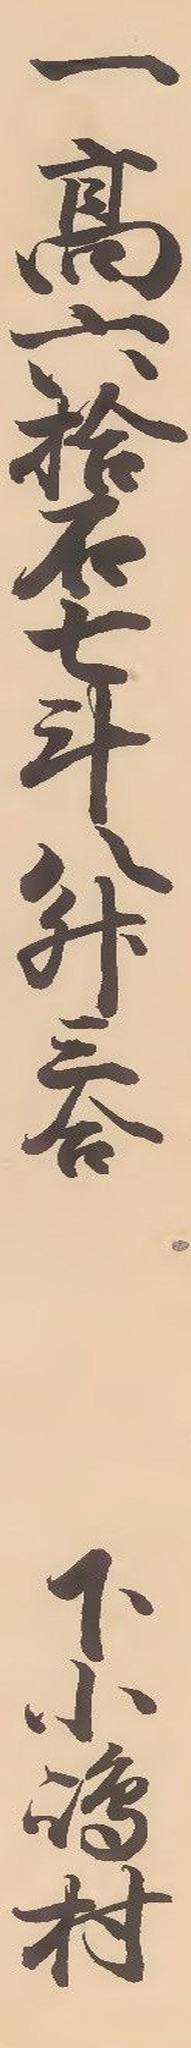一高六拾石七斗八升三合下小島村
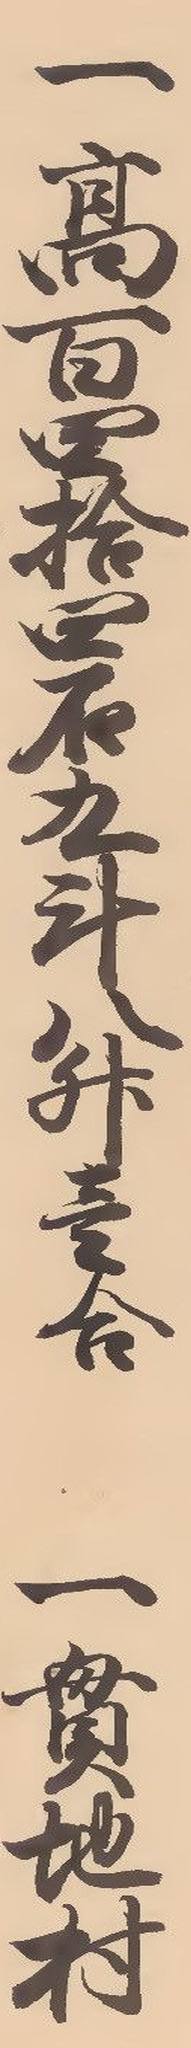一高百四拾四石九斗八升壱合一貫地村
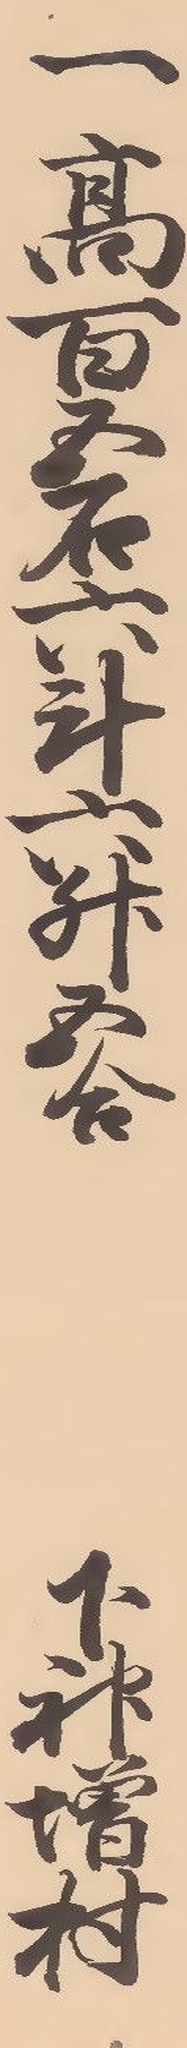一高百五石六斗六升五合下神増村
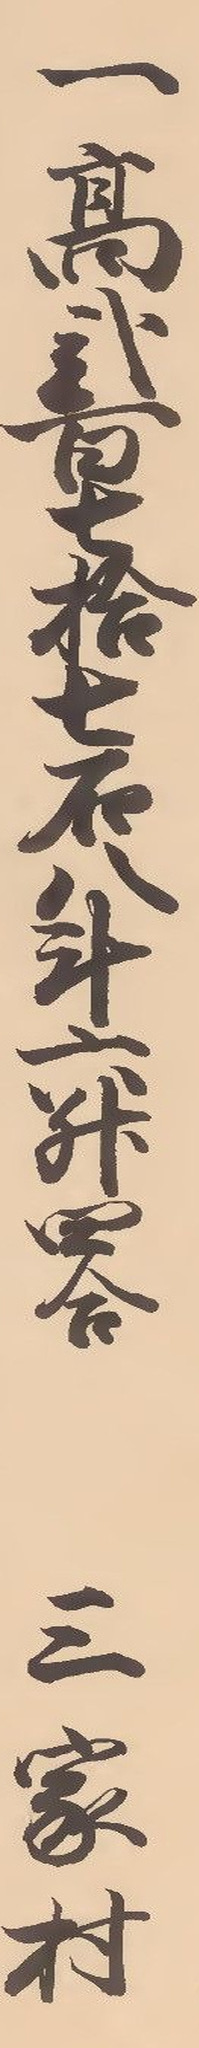一高弐百七拾七石八斗六升四合三家村
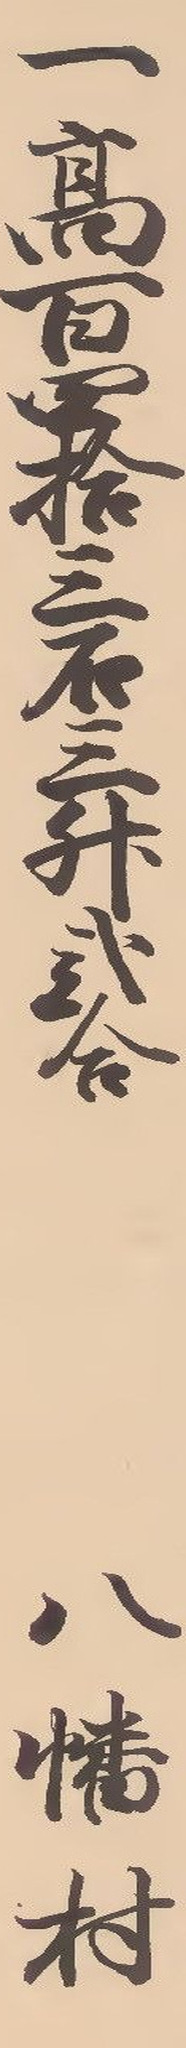一高百四拾三石三升弐合八幡村
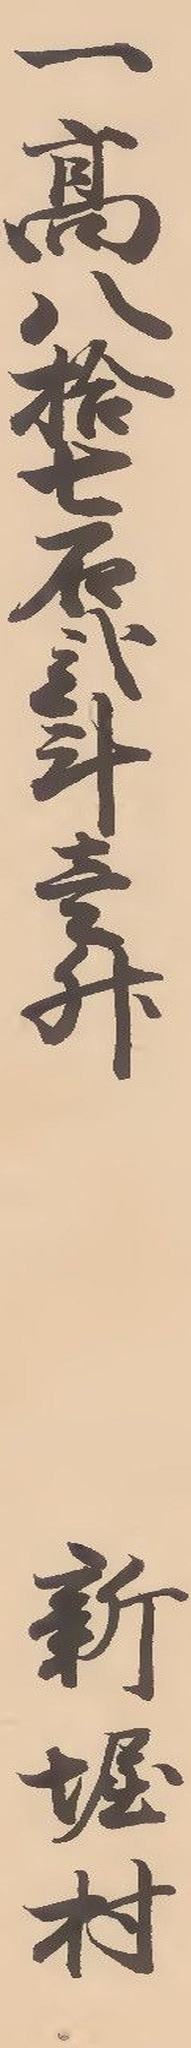一高八拾七石弐斗壱升新堀村
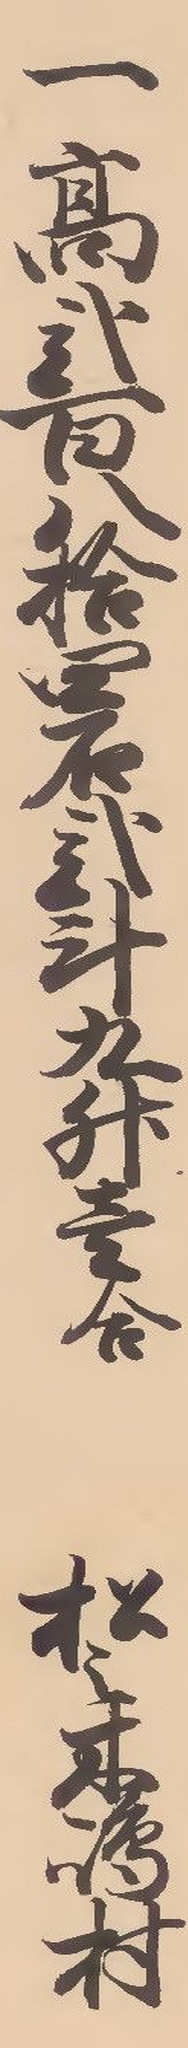一高弐百八拾四石弐斗九升壱合松之木島村
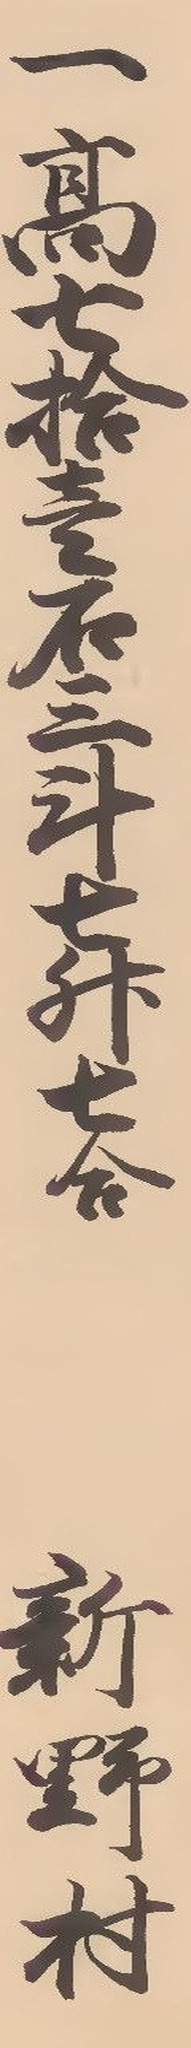一高七拾壱石三斗七升七合新野村

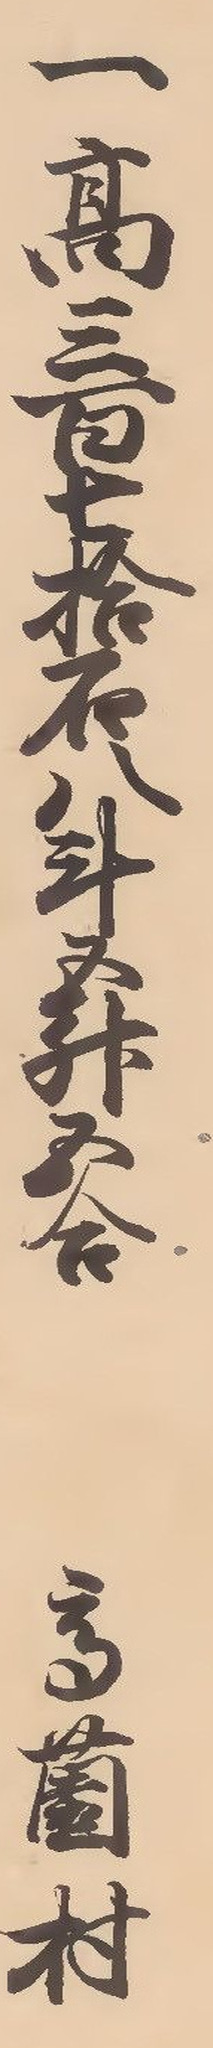一高三百七拾石八斗五升五合高薗村
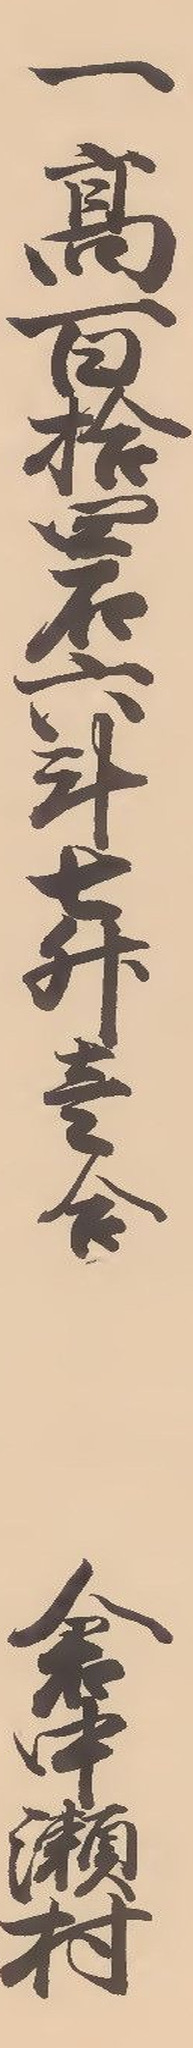一高百拾四石六斗七升壱合倉中瀬村
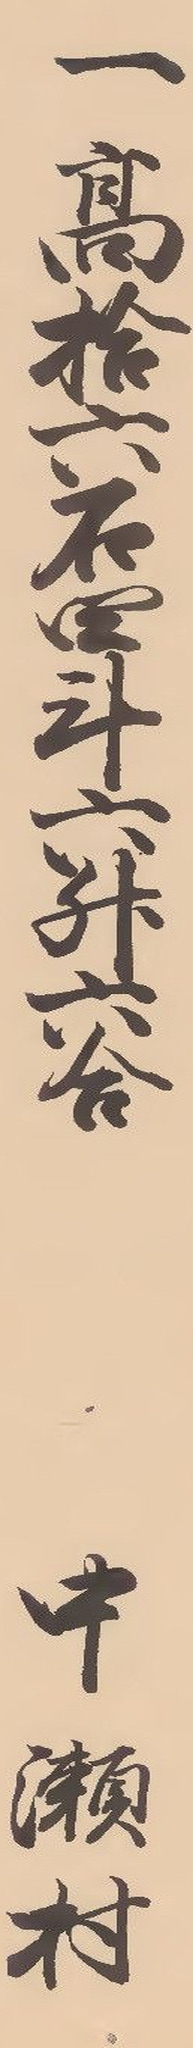一高拾六石四斗六升六合中瀬村
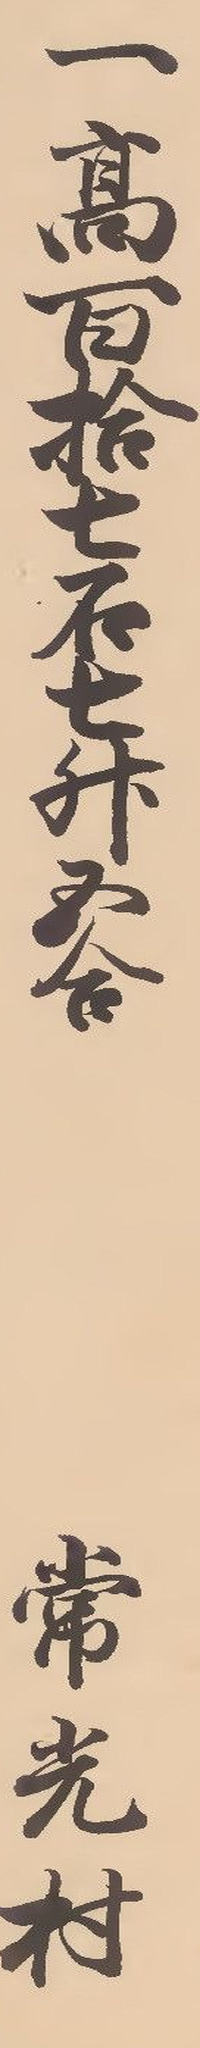一高百拾七石七升五合常光村
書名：遠江国郷帳
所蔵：国立公文書館 National Archives of Japan
